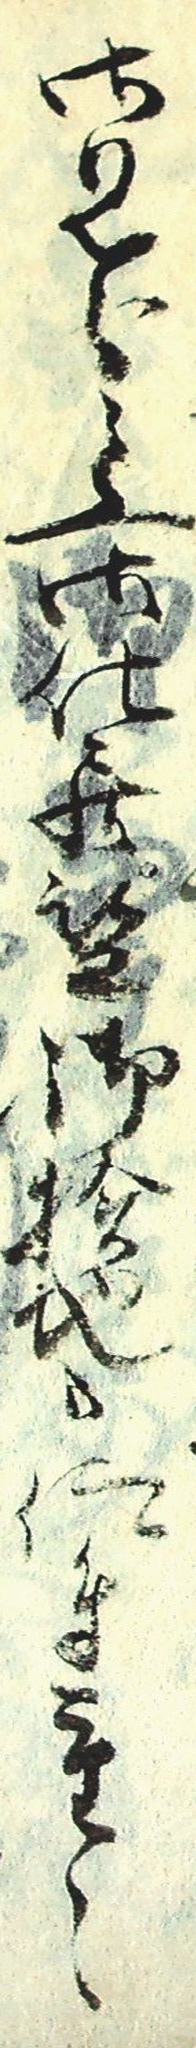御見分之上御仕居替御検地被仰付重々
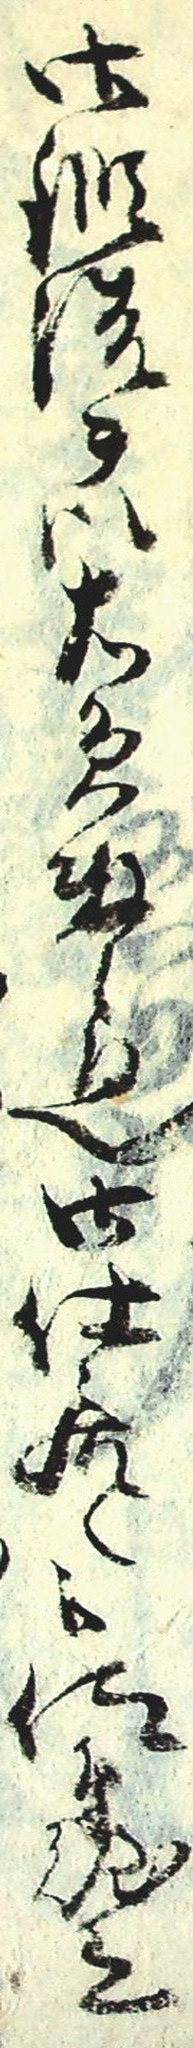御鍛詰を以右員数之通御仕居へ被仰付難有
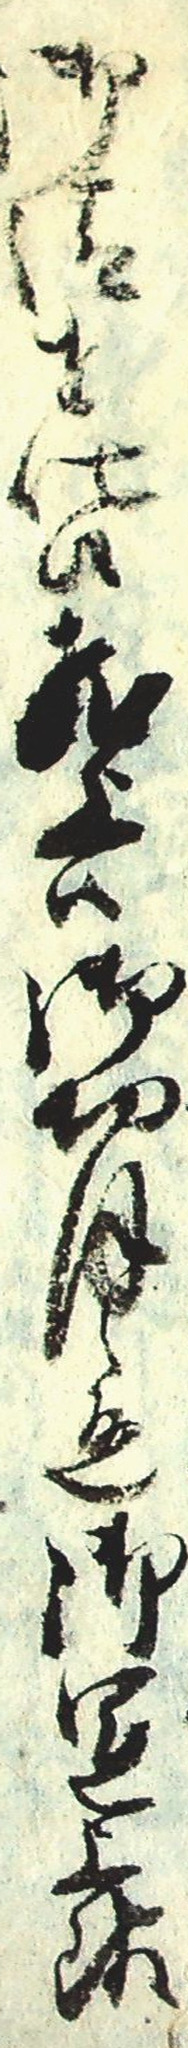御請奉仕候然上は御切月之通御運上銀
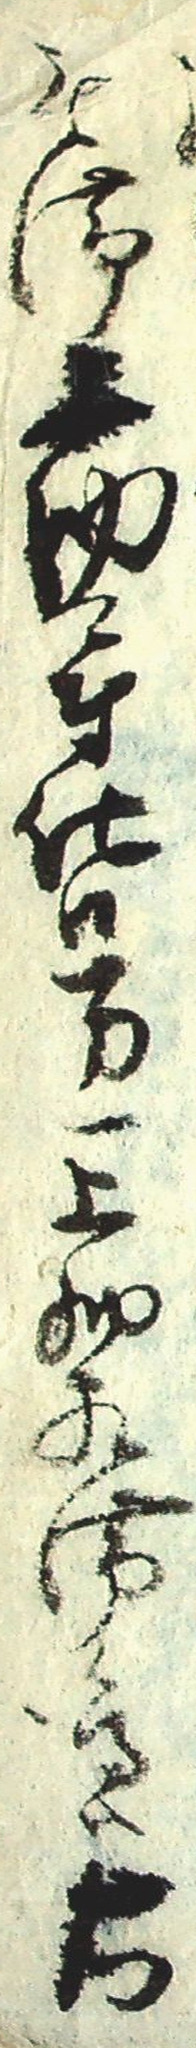無滞上納可奉仕候万一上納相滞候得は右

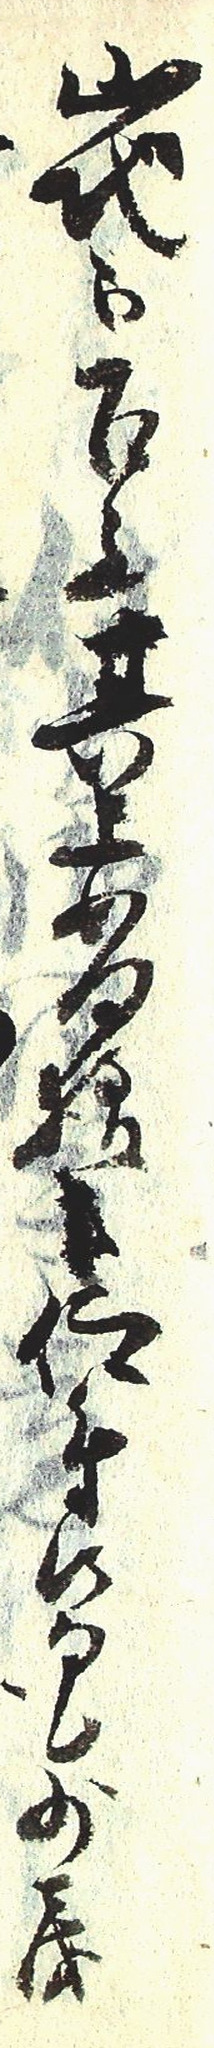山地被召上其上如何様被仰付候ても少も
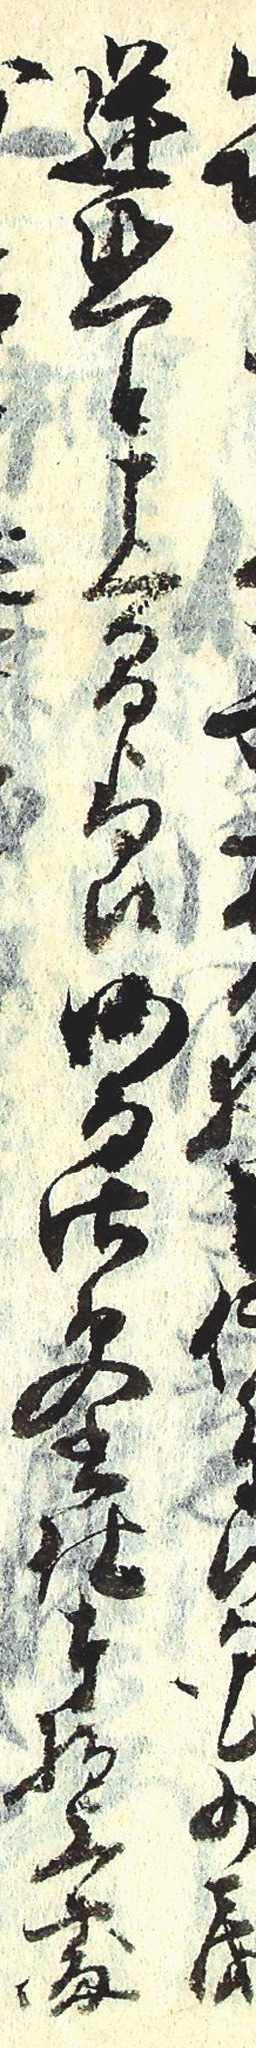迷惑と申上間布候仍て御受書仕奉指上処
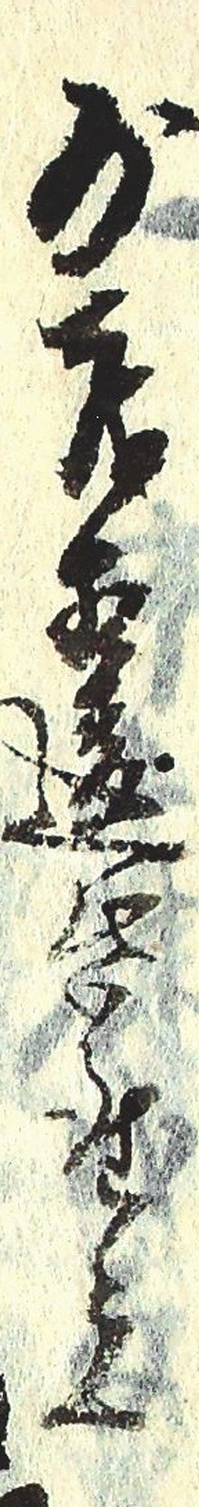少も相違無御座候以上
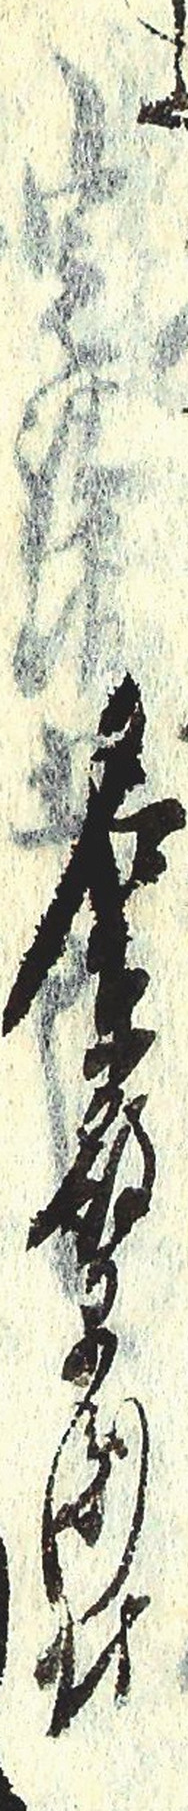名東郡早淵村
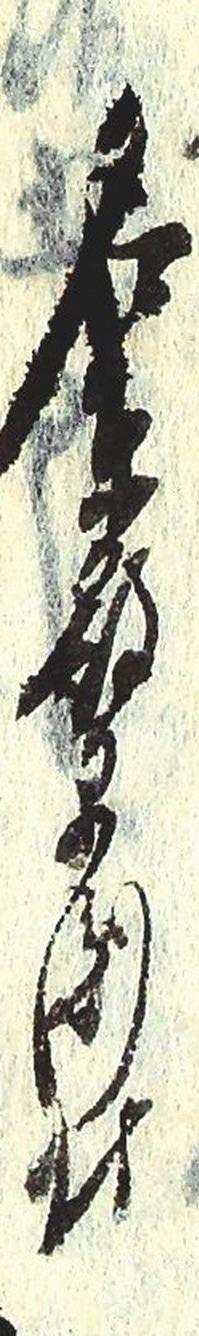名東郡早淵村
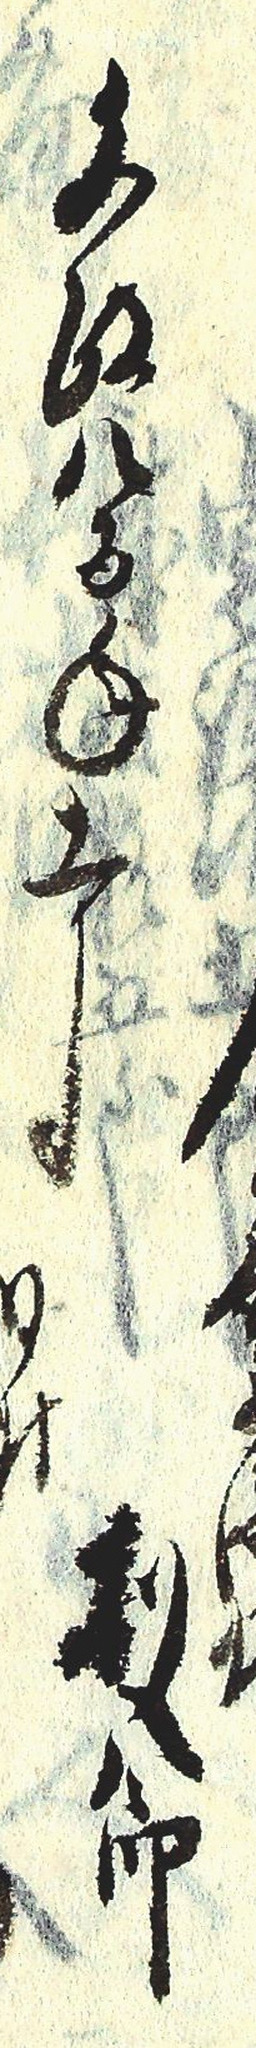文政八酉年十一月利八郎
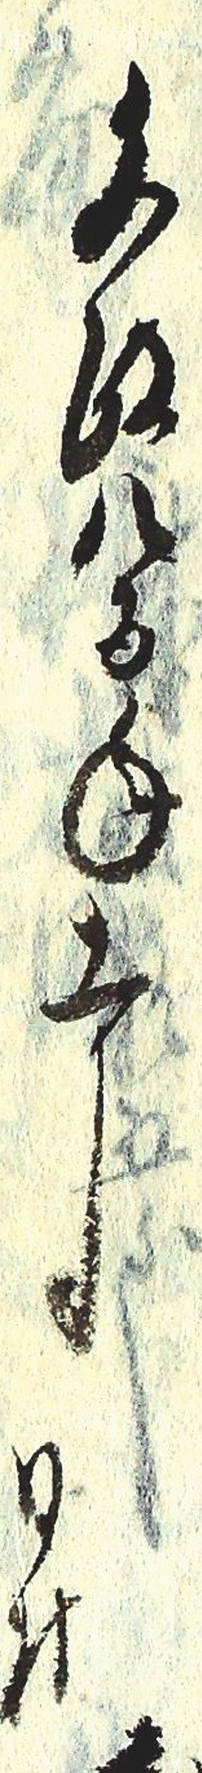文政八酉年十一月利八郎
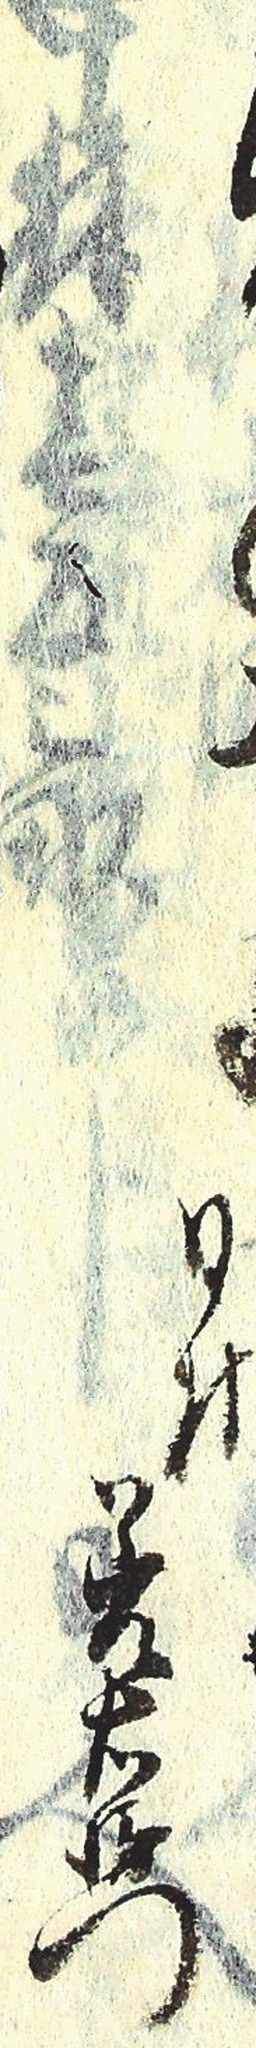善右衛門
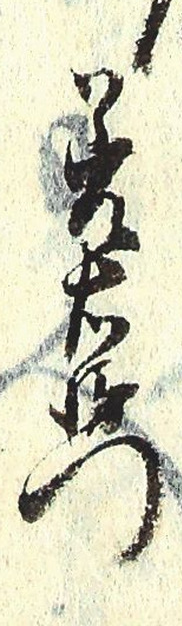善右衛門
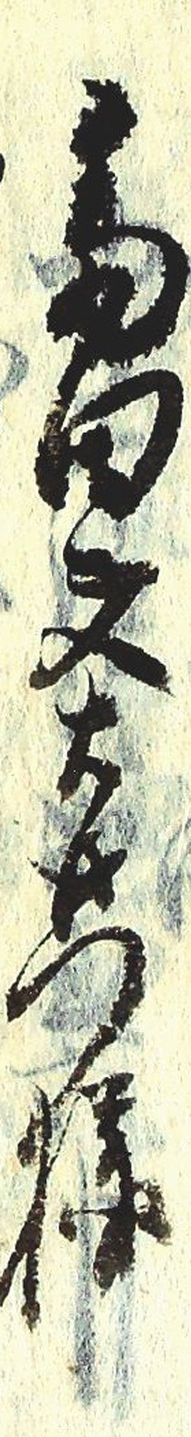多田文右衛門様
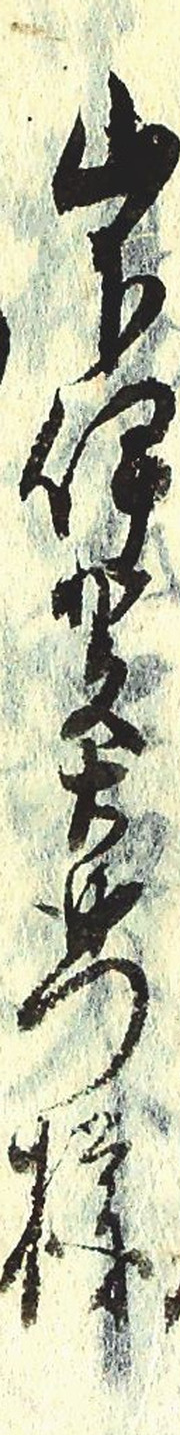山下伊賀右衛門様
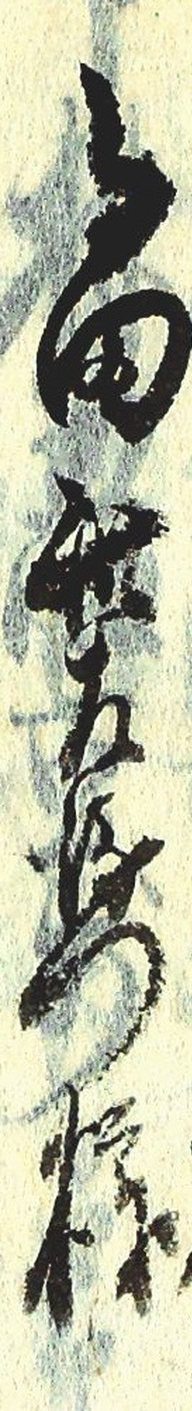高田此左衛門様
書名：諸御願書控(弐番）
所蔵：鳴門教育大学 Naruto University of Education
